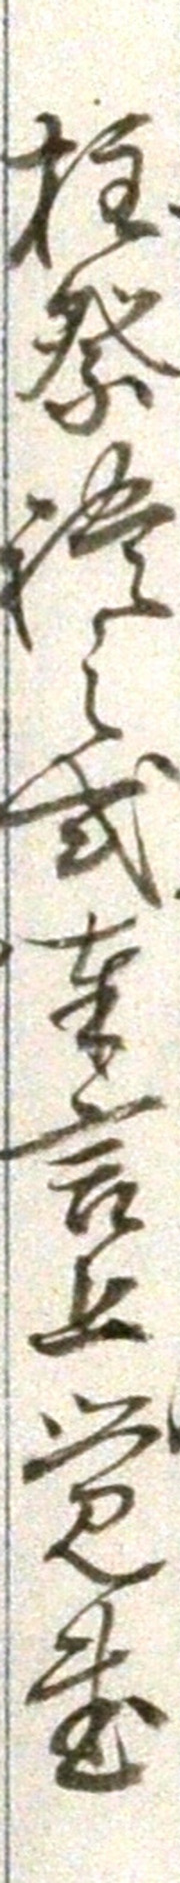柱祭礼之式奉言上覚書
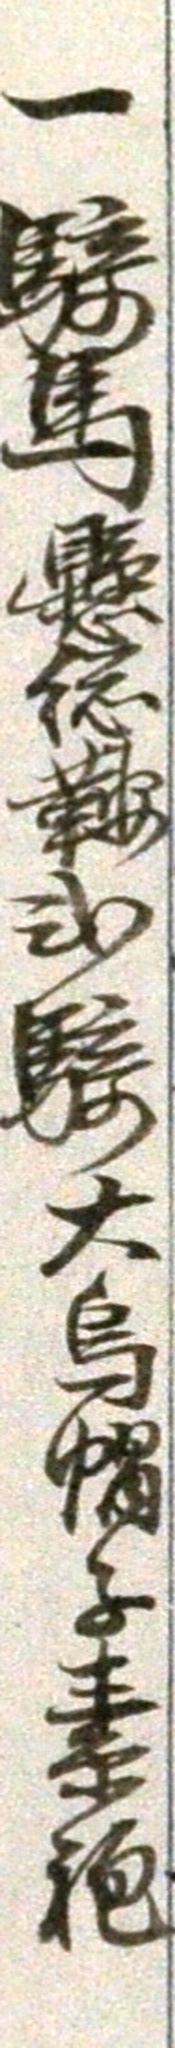一騎馬懸総鞍弐騎大烏帽子素袍
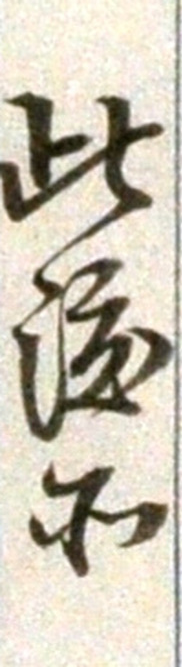此渡所
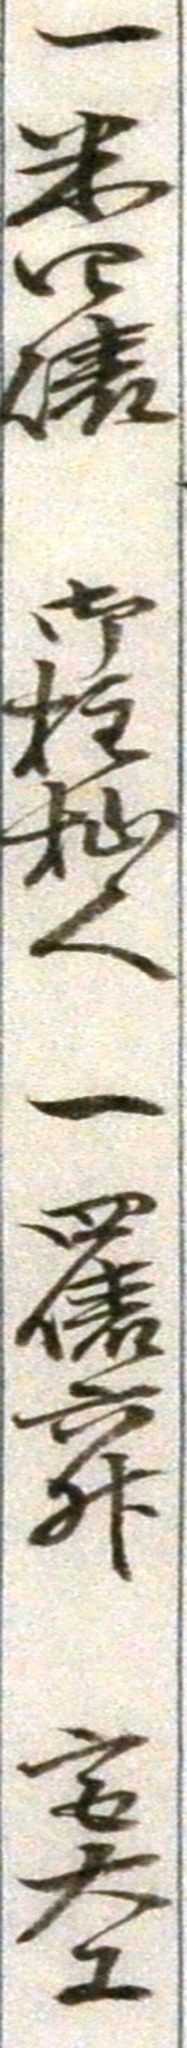一米四俵御柱杣人一四俵六升宮大工
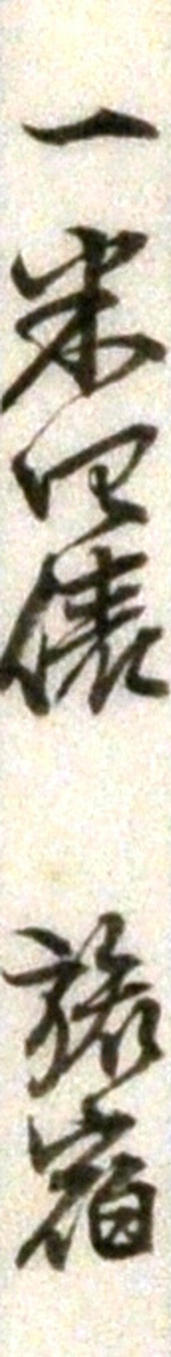一米四俵旅宿
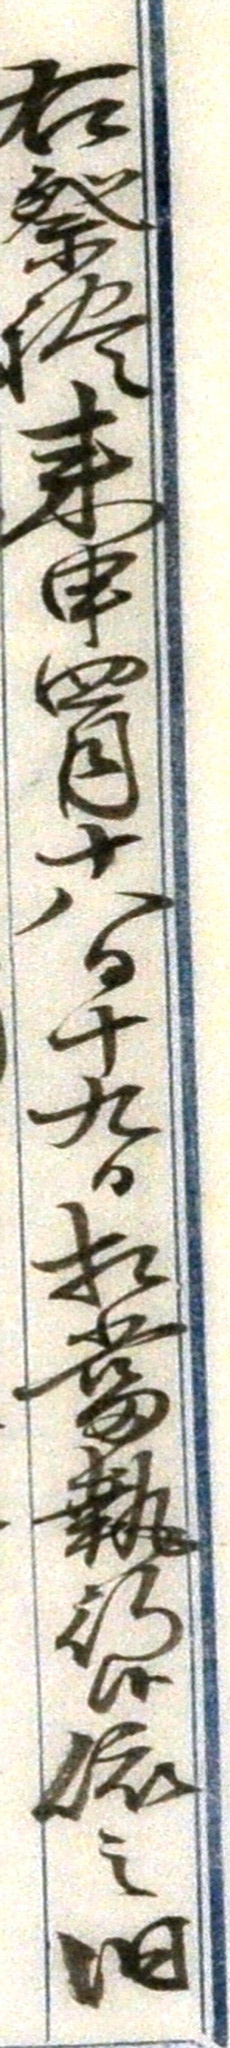右祭礼来申四月十八日十九日相当執行候依之旧
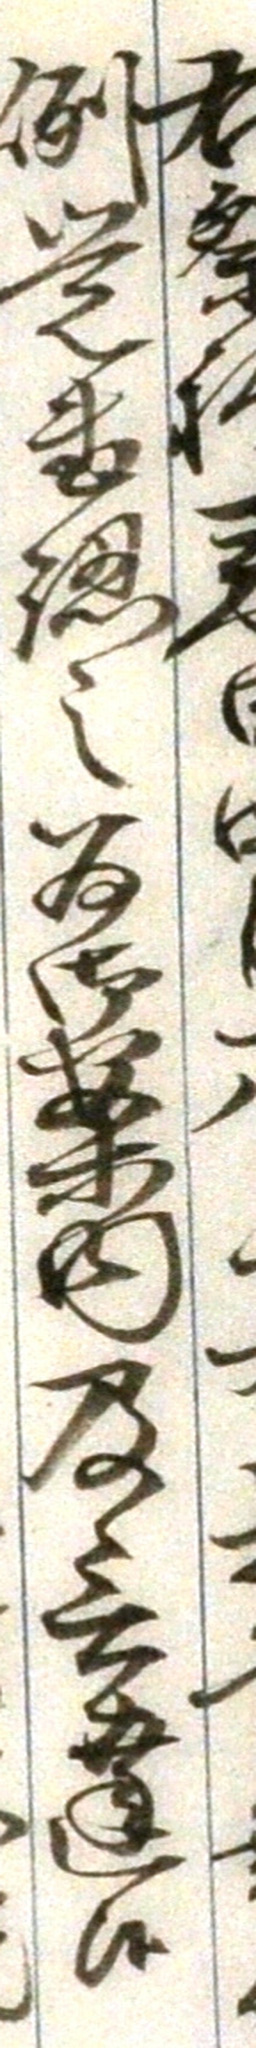例覚書認之為御案内及言達候
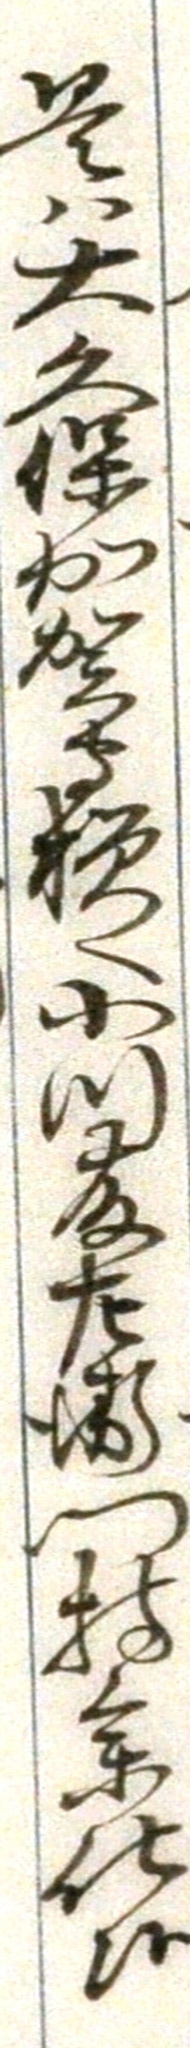是ハ大久保加賀守様へ小川藤左衛門持参仕候
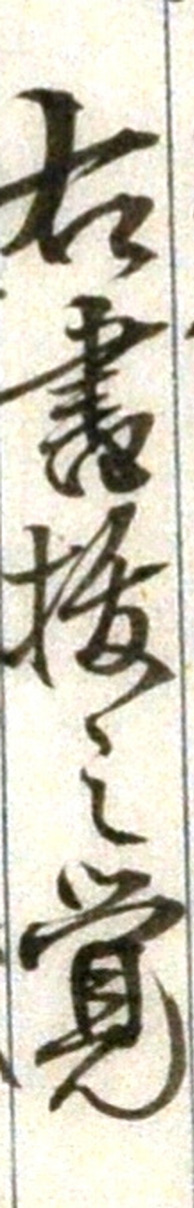右書抜之覚
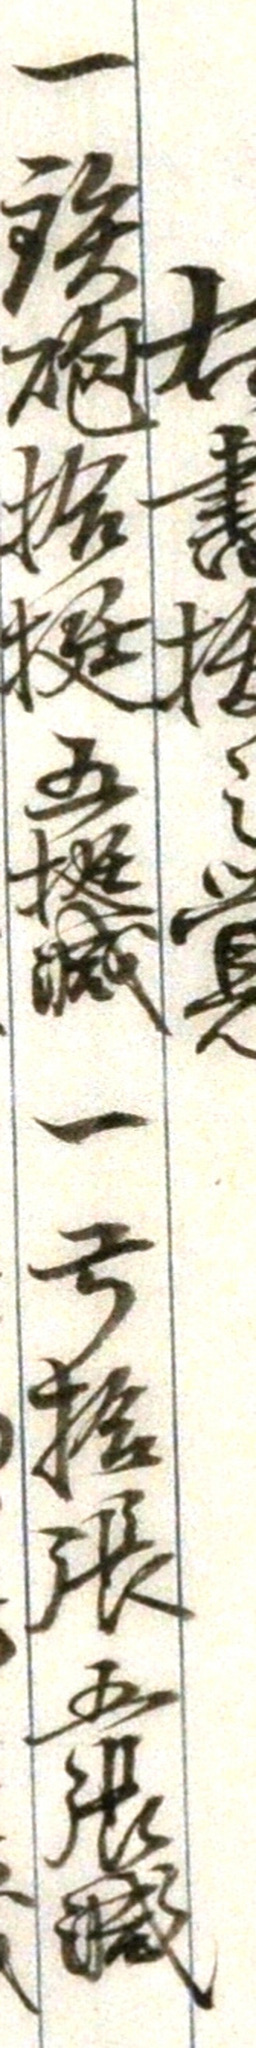一鉄炮拾挺五挺減一弓拾張五張減
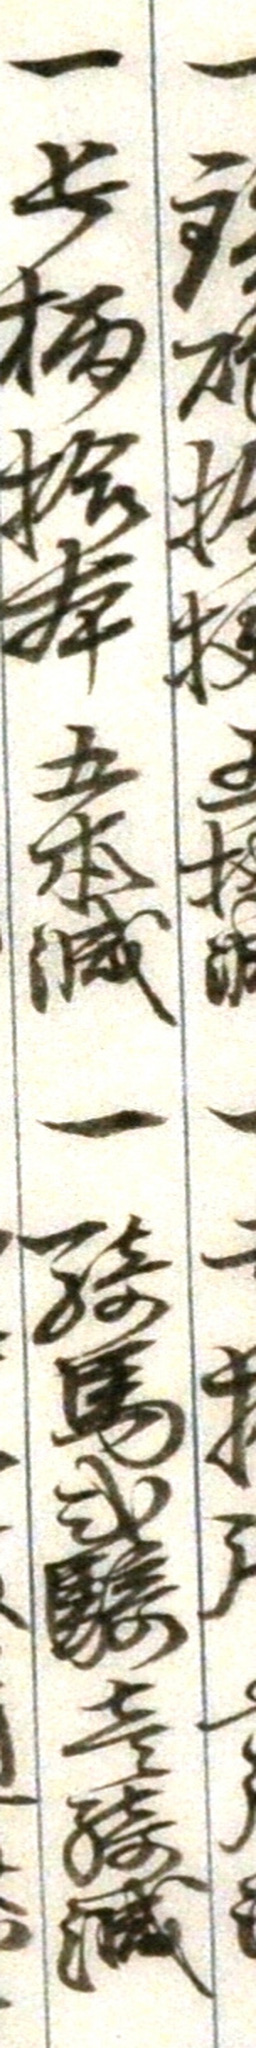一長柄拾本五本減一騎馬弐騎壱騎減
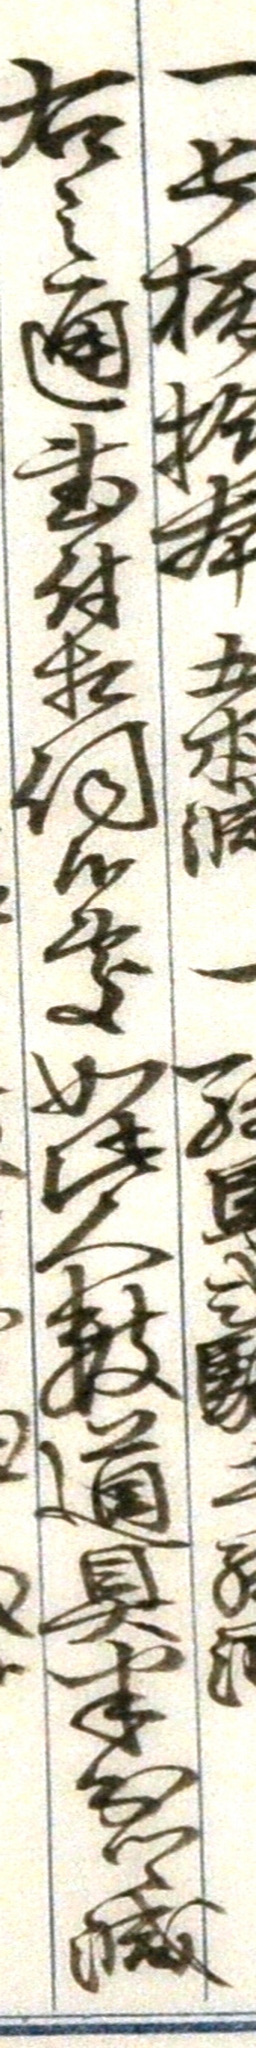右之通書付相伺候処如此人数道具半分ツヽ減
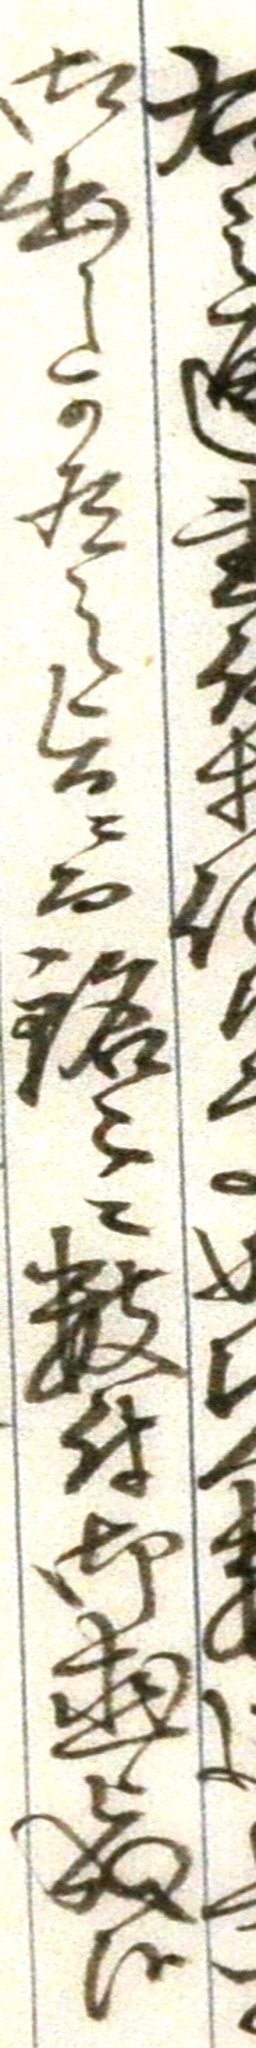御出し可有之旨ニ而銘々ニ数付御直被成候
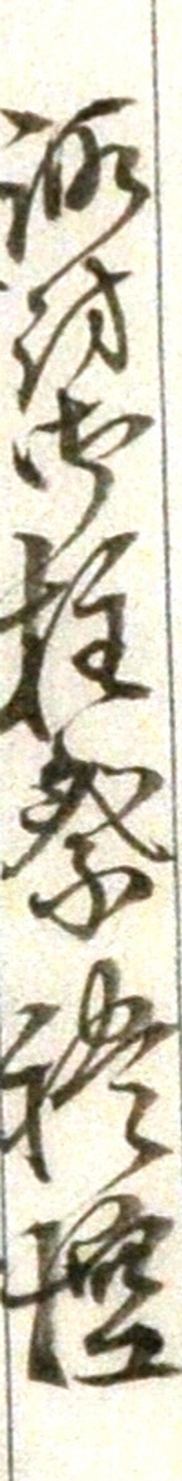諏訪御柱祭礼控
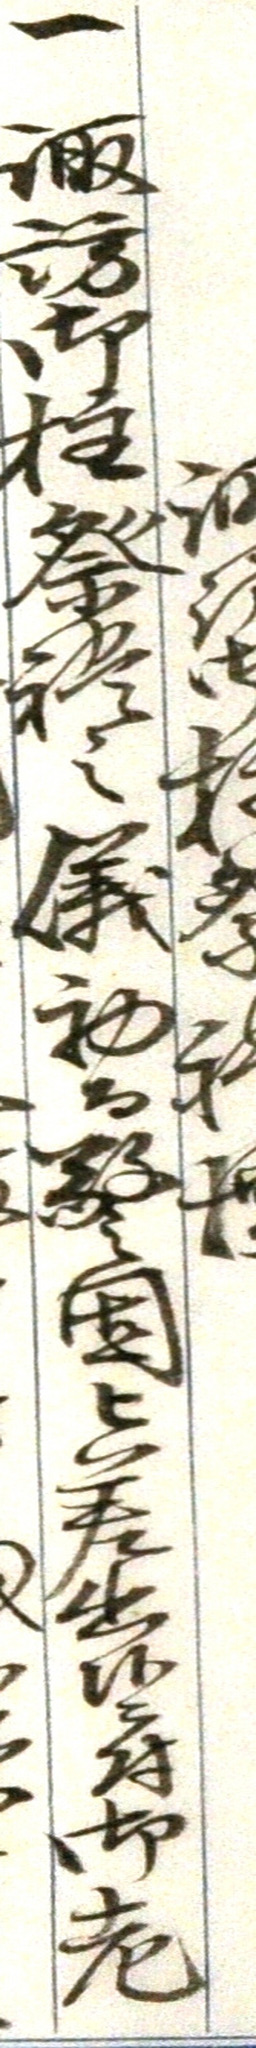一諏訪御柱祭礼之儀初而警固被差出候ニ付御老
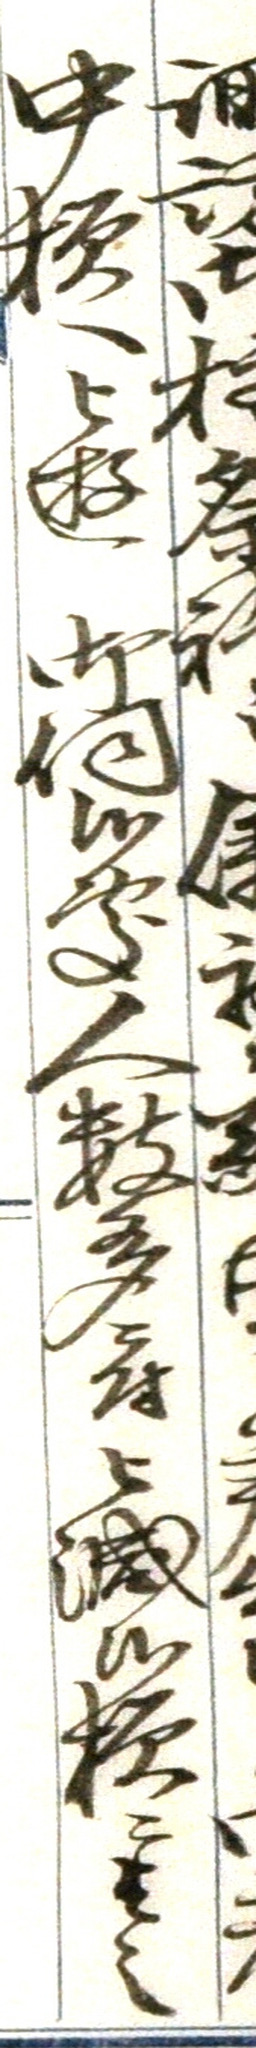中様へ被遊御伺候処人数多ニ付被減候様ニ有之
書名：諏訪御柱祭之節・騎馬大将御中間頭・御柱引人足
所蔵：伊那市立高遠町図書館・合同会社AMANE
